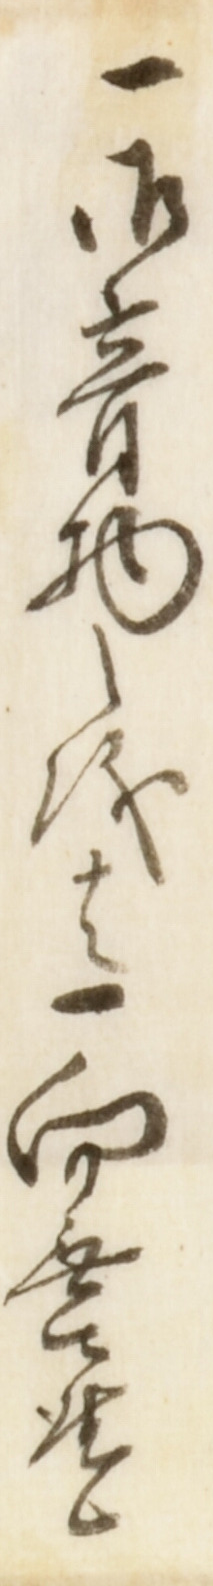一御音物之儀は一向無御座候
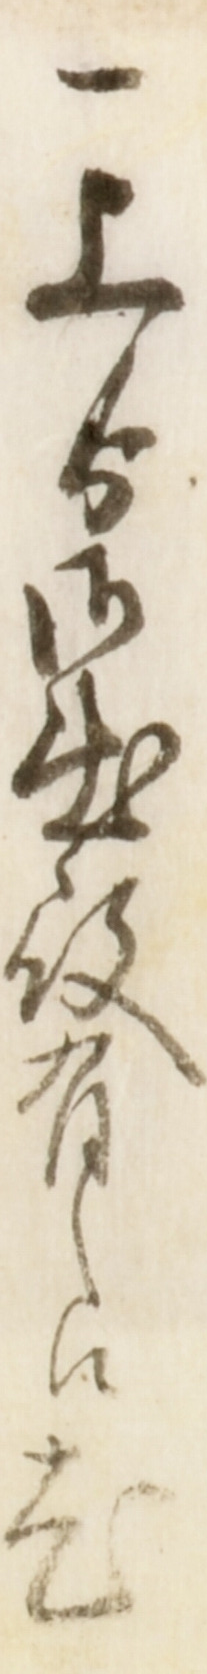一上ゟ御出役有之候尤
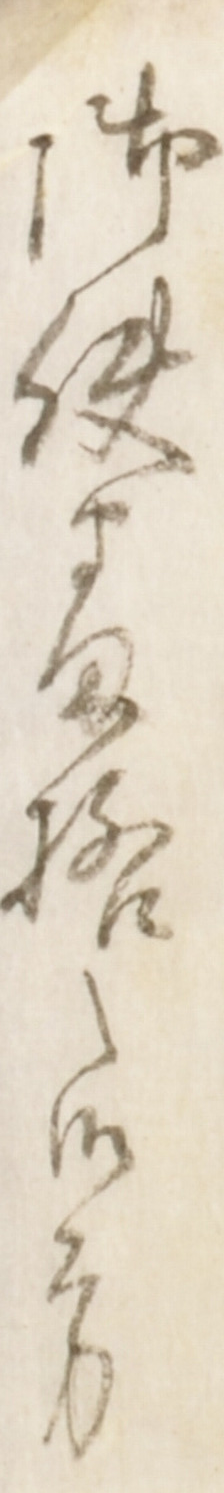御使番格之御方

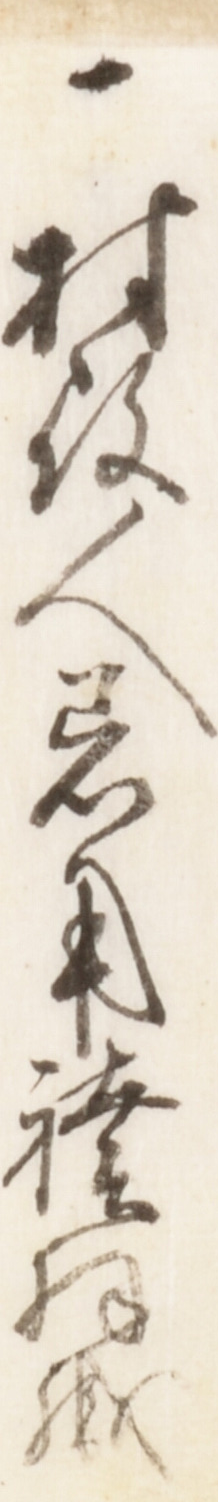一村役人着用袴羽織
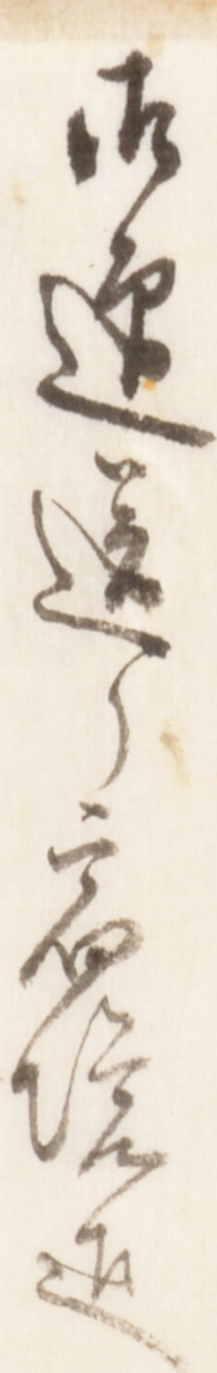御迎送り宿境迄
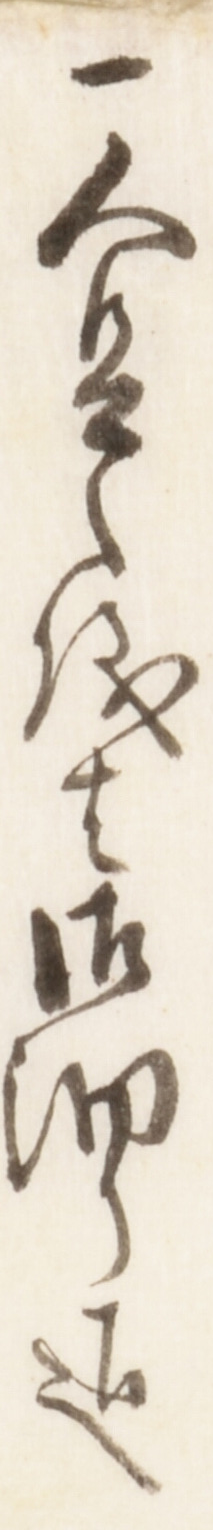一人足之儀は御泊り迄
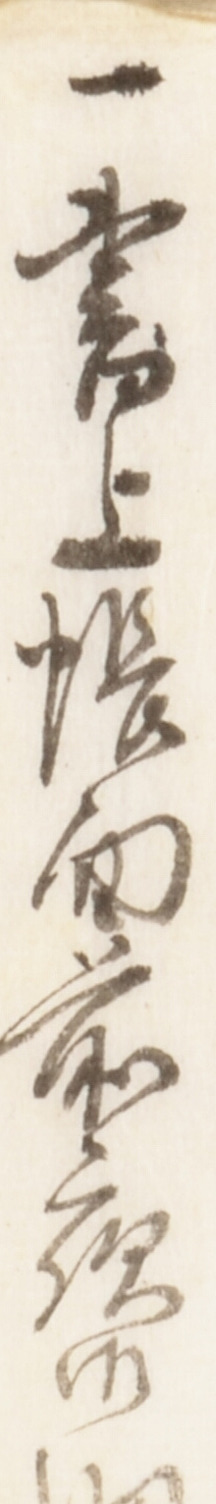一書上帳面前夜御泊
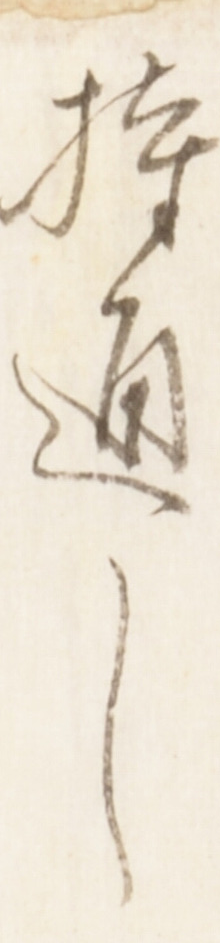持通し
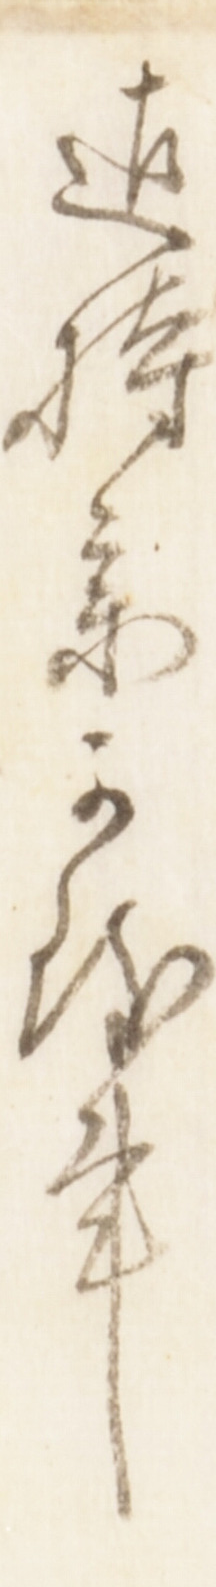迄持参可致事
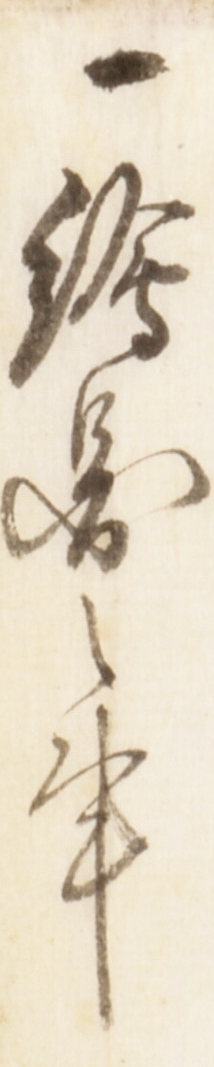一絵図之事
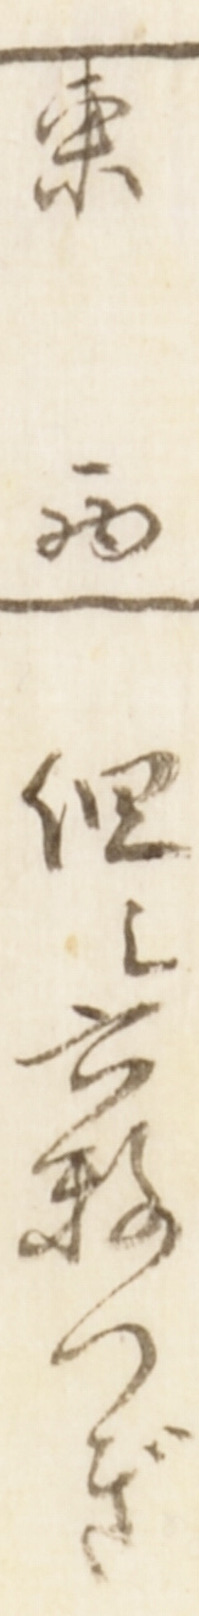東西但し六枚つぎ
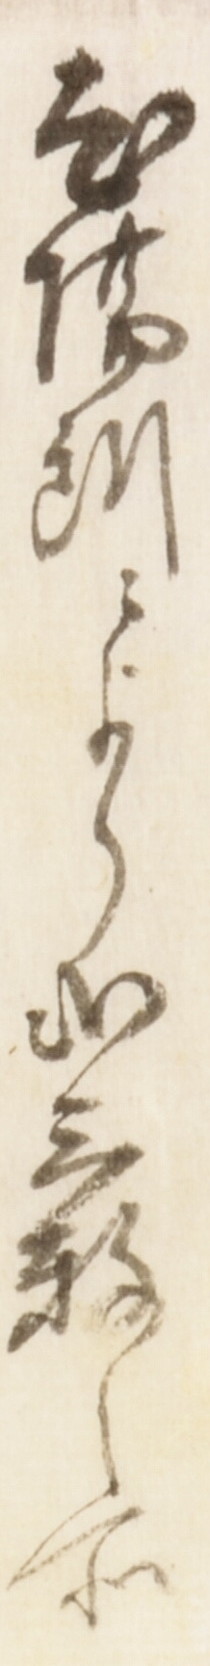尤場所ニより弐三枚之所
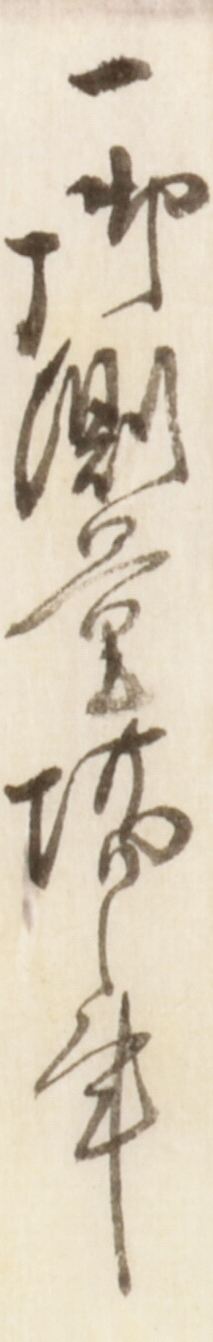一御測量場之事
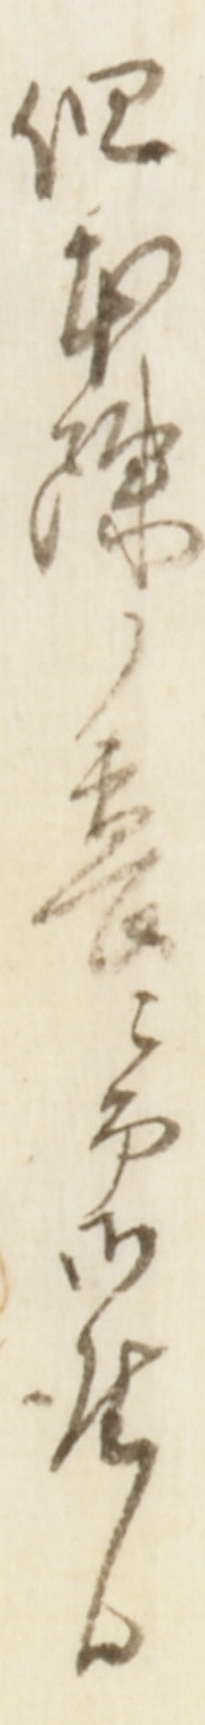但本陣ノ裏ニ而御座候

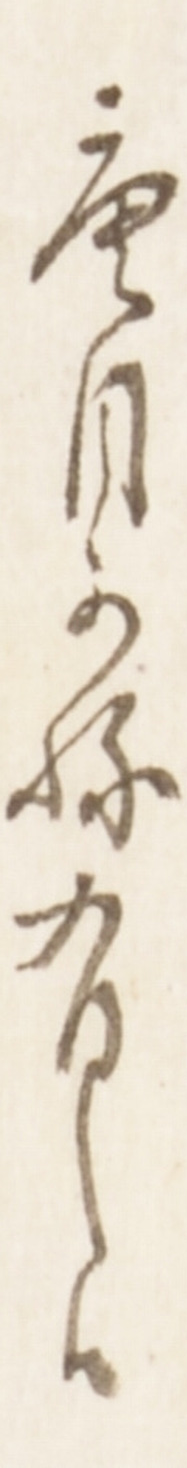唐目かね有之候
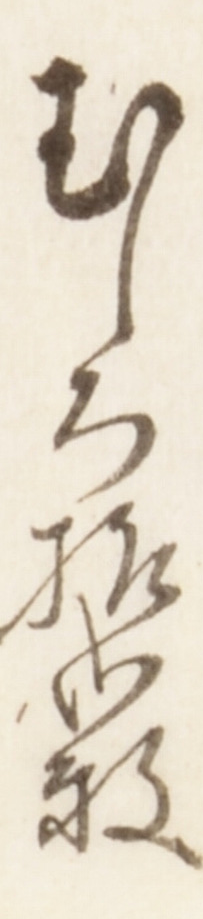むしろ拾弐枚
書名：（諸事控）
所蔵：伊那市立高遠町図書館・合同会社AMANE
